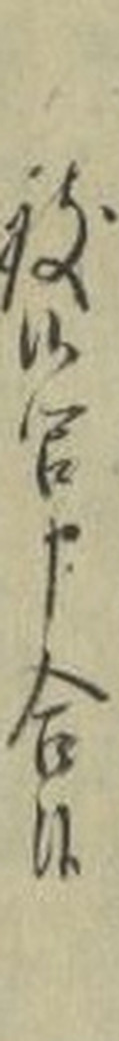致候筈申合候
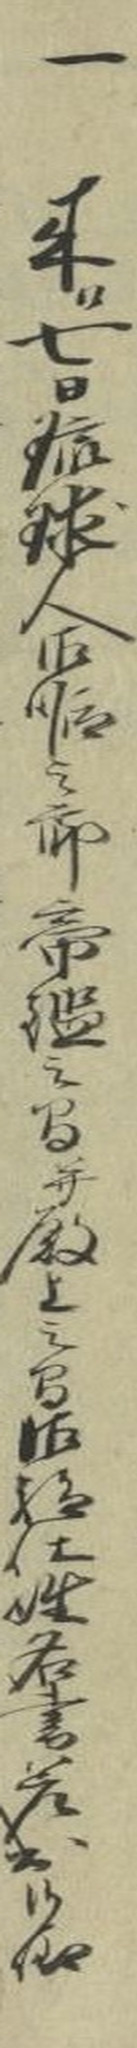一来る七日琉球人御暇之節帝鑑之間并殿上之間御給仕姓名書差出候様
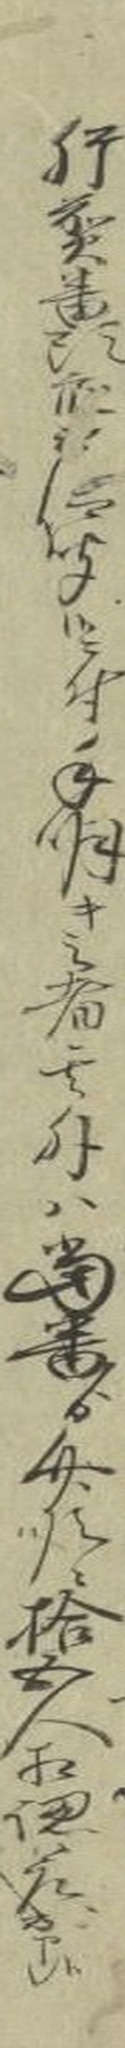肝煎番頭衆被仰聞候に付手明き之者其外は当番ゟ介順に拾五人相認差出申候
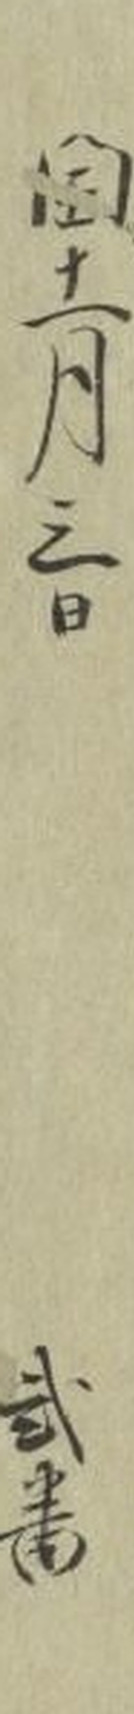閏十一月三日弐番
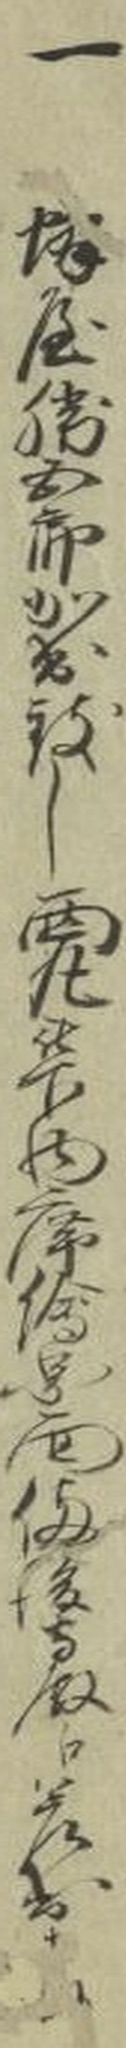一蜂屋勝五郎加出致し西丸被下物席絵図面備後守殿え差出申候
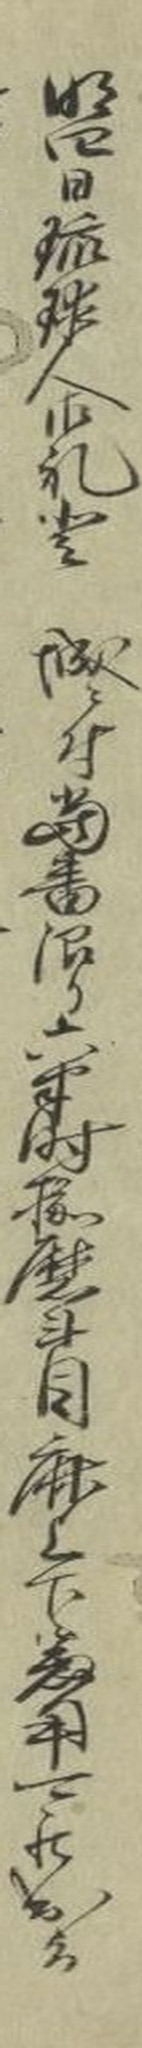一明四日琉球人御礼登城に付当番限り六半時揃熨斗目麻上下着用可罷出旨
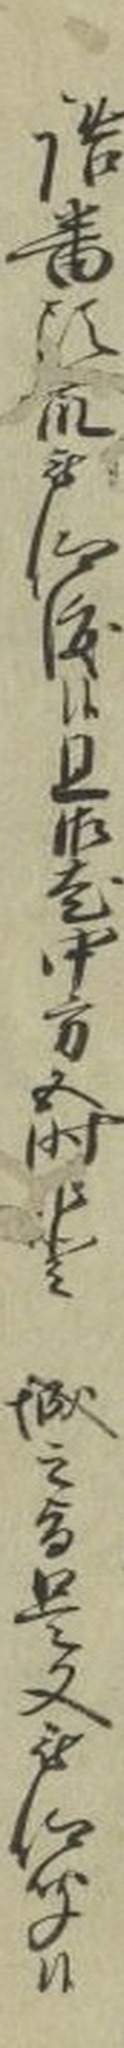詰番頭衆被仰渡候且御老中方五時御登城之旨是又被仰聞候
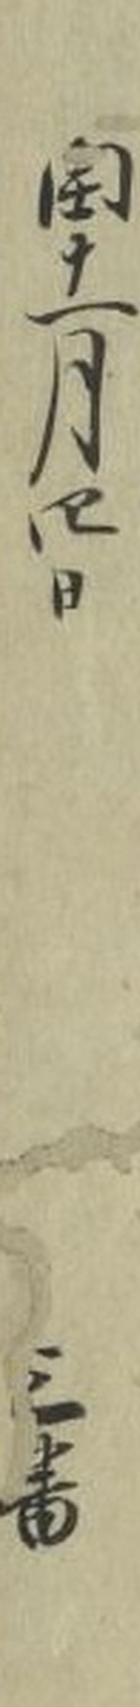閏十一月四日三番

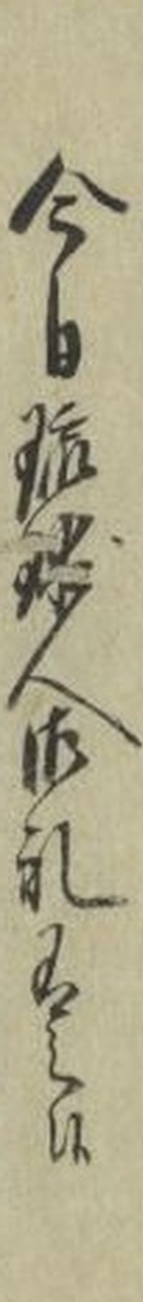一今日琉球人御礼有之候
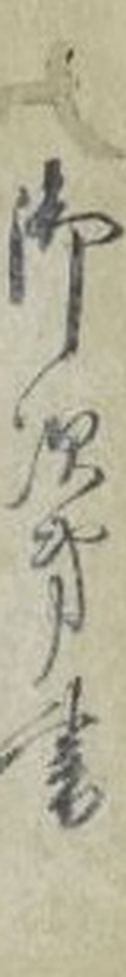御次第書
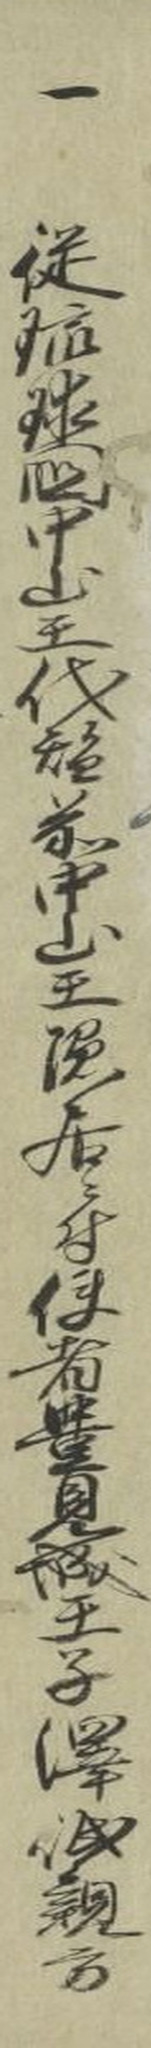一従琉球国中山王代替前中山王隠居に付使者豊見城王子沢岻親方
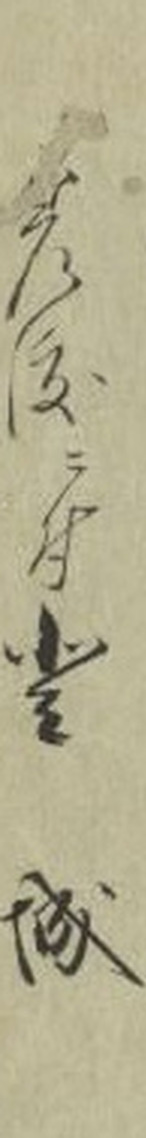差渡に付登城
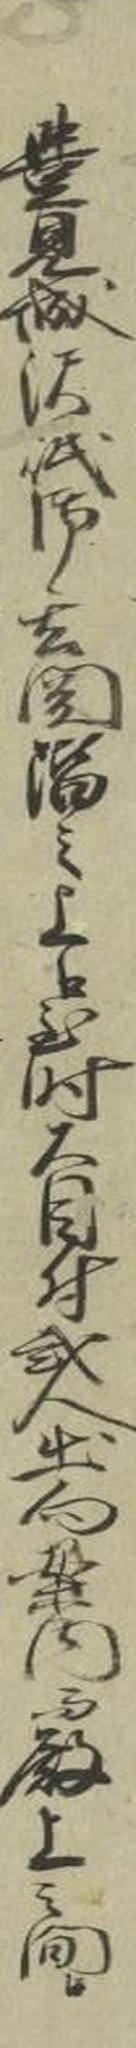一豊見城沢岻御玄関階之上え至時大目付弐人出向案内而殿上之間え
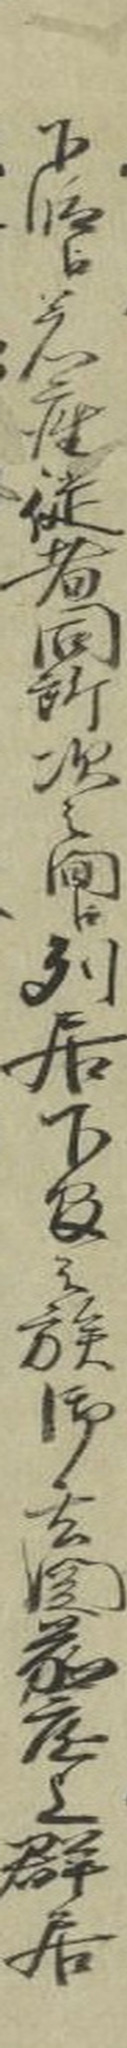下段え着座従者同所次之間え列居下官之族御玄関前庭上群居
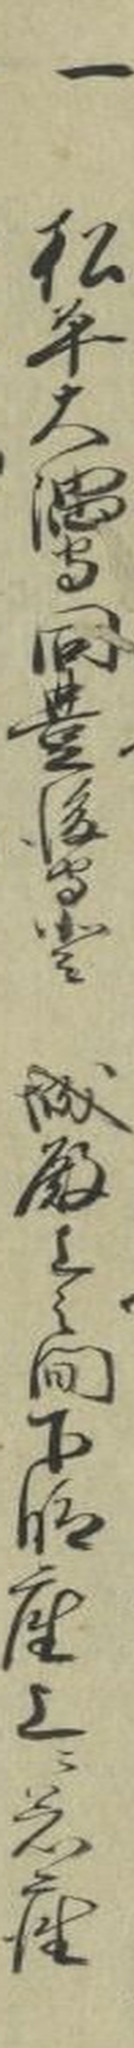一松平大隅守同豊後守登城殿上之間下段座上に着座
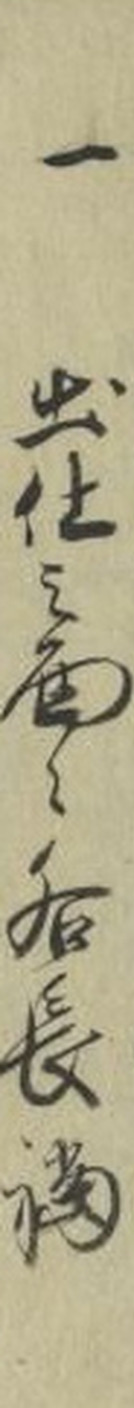一出仕之面々各長襠
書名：天保三壬辰年琉球人参府之節勤方書留
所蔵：University of the Ryukyus Library
